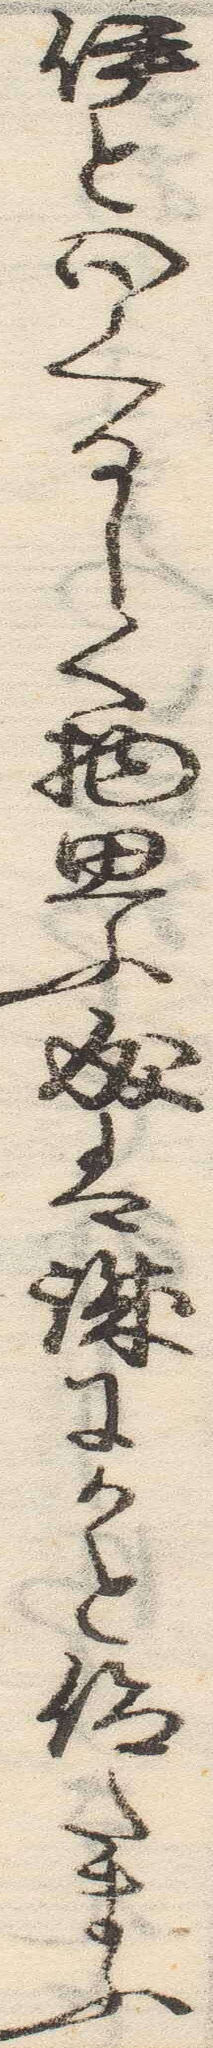いと心くるしく物思ふ成は誠にかと仰たまふ
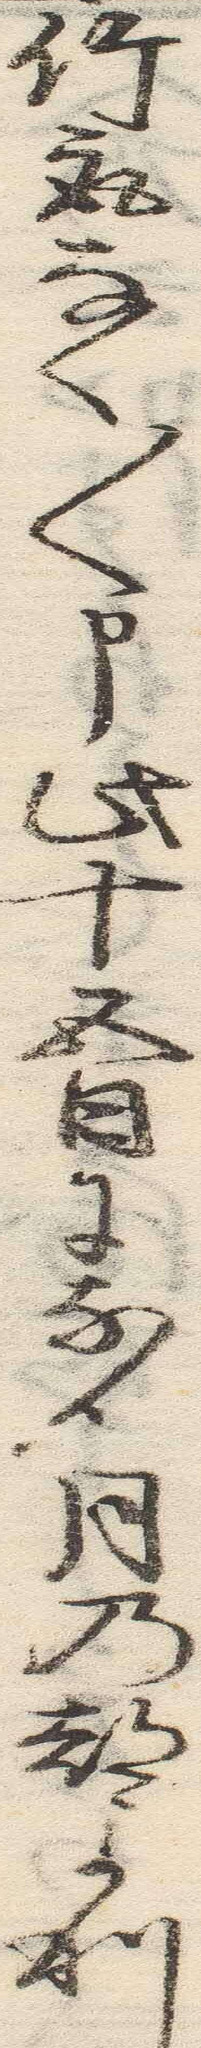竹取なく〳〵申此十五日になん月の都より
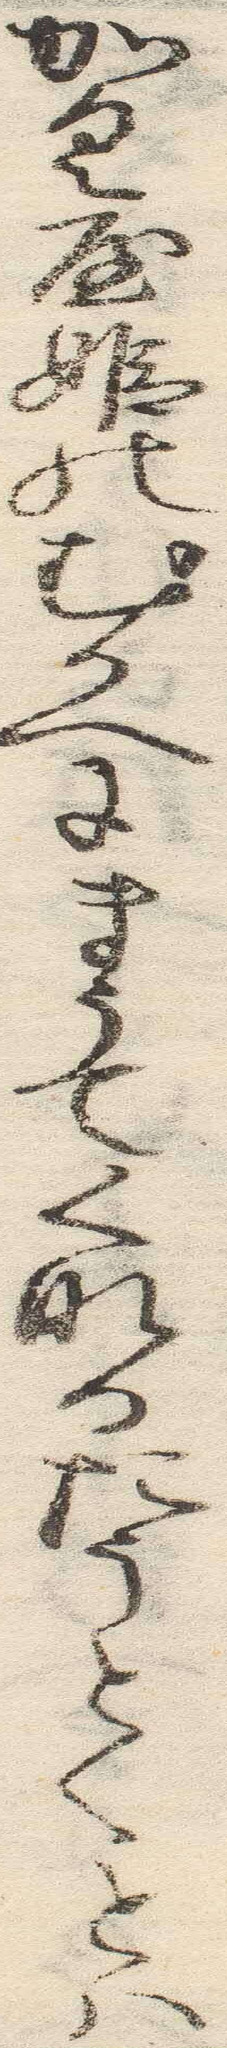かくや姫のむかへにまうてくなるたうとくとは
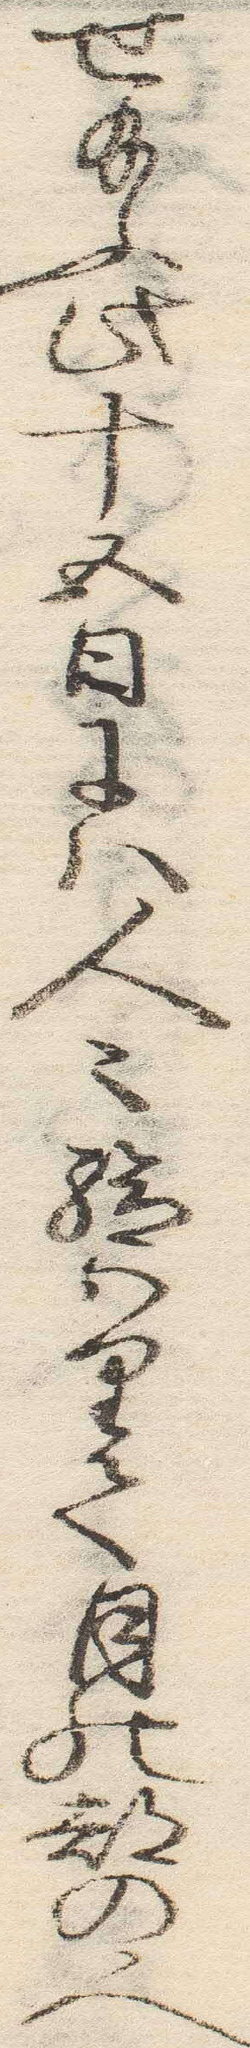せ給ふ此十五日には人々給はりて月の都の人
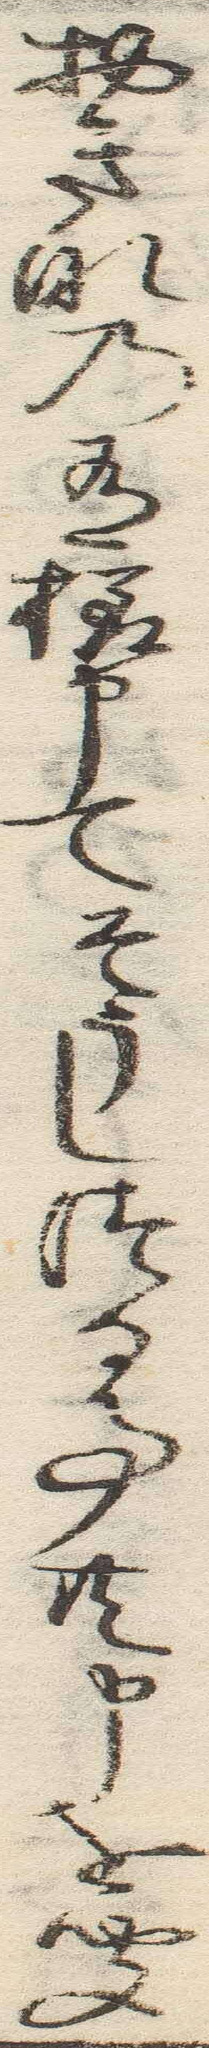おきなの有様申てそうしつる事共申を聞
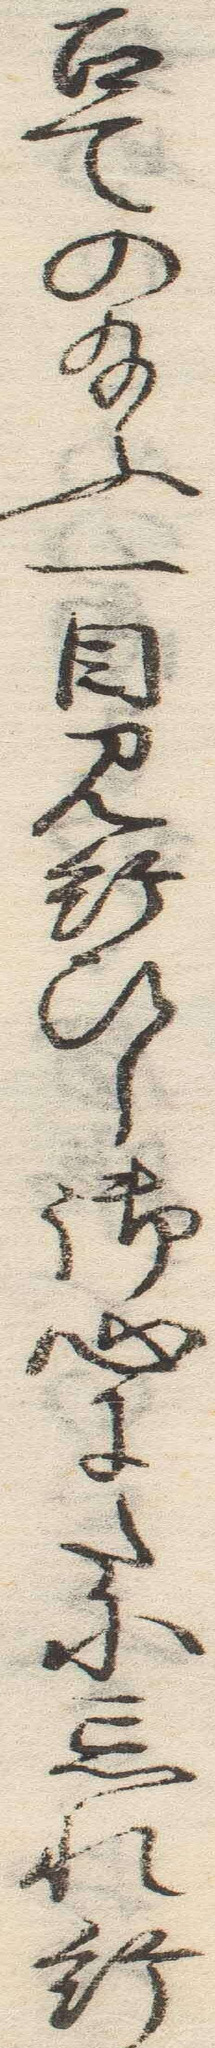召ての給ふ一目見給ひし御心にたに忘れ給
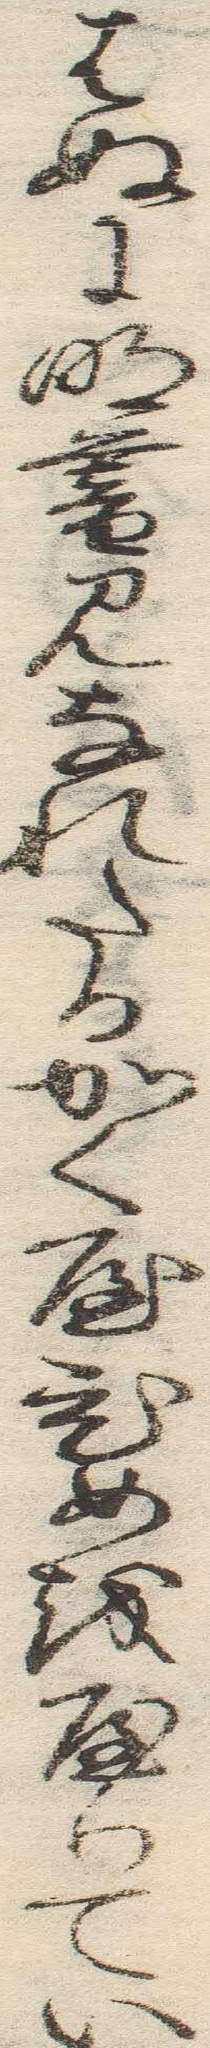はぬに明暮見なれたるかくやひめをやりてい
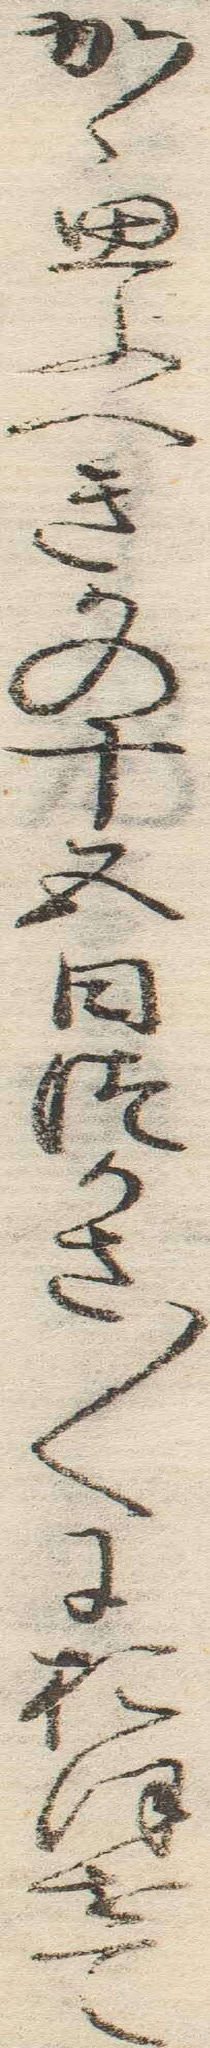かゝ思ふへきかの十五日つかさ〳〵におほせて
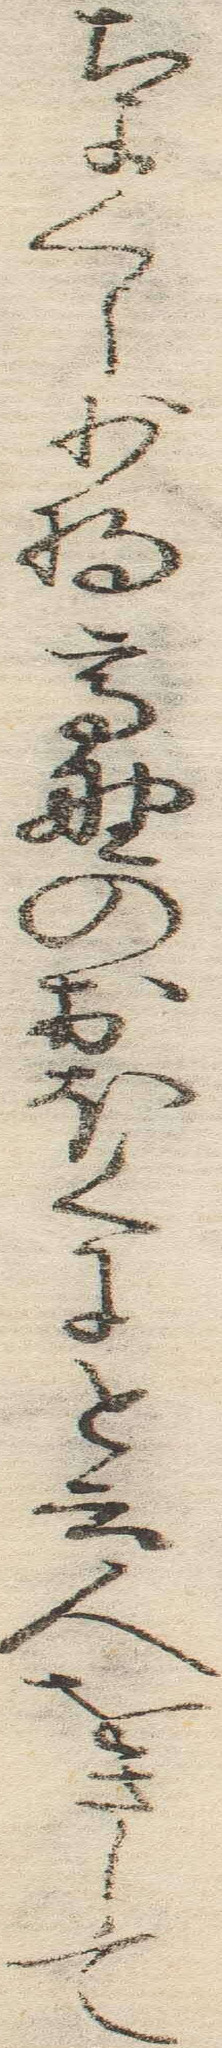ちよくし少将高野のおほくにと云人をさして
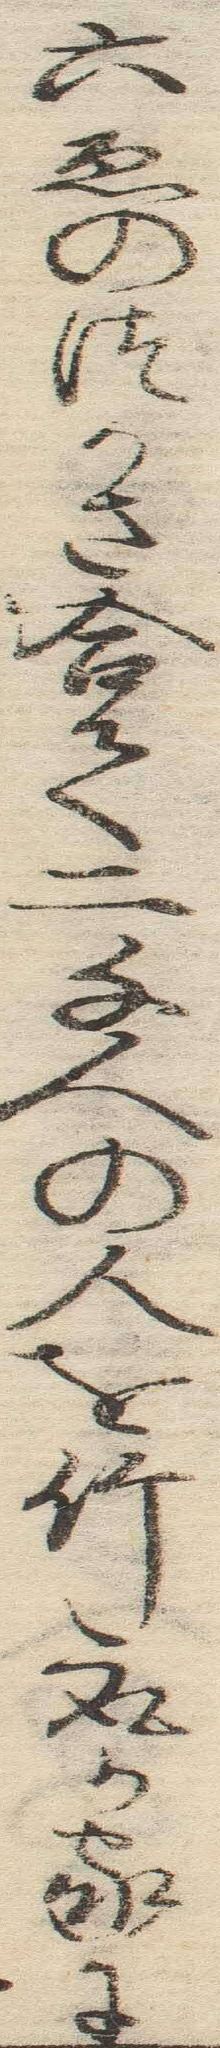六ゑのつかさ合て二千人の人を竹取か家に

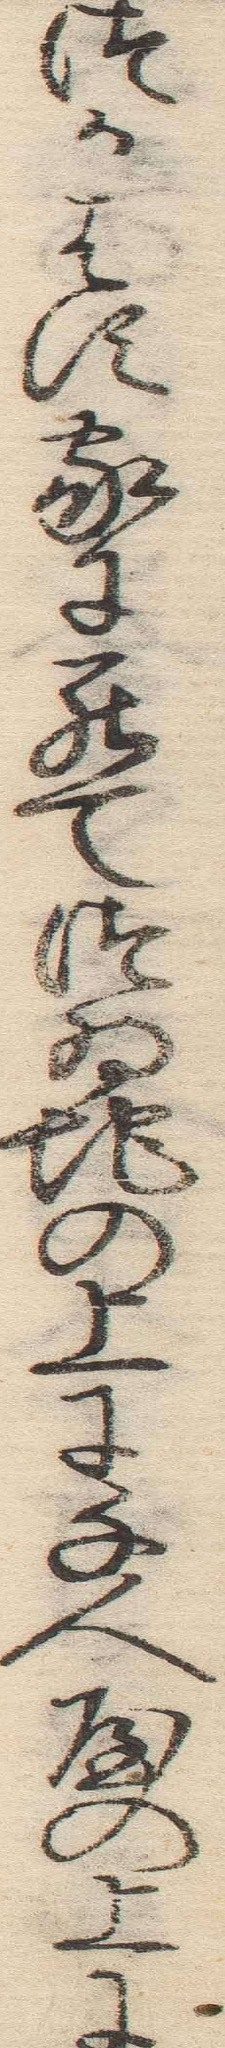つかはす家に罷てつゐ地の上に千人屋の上に
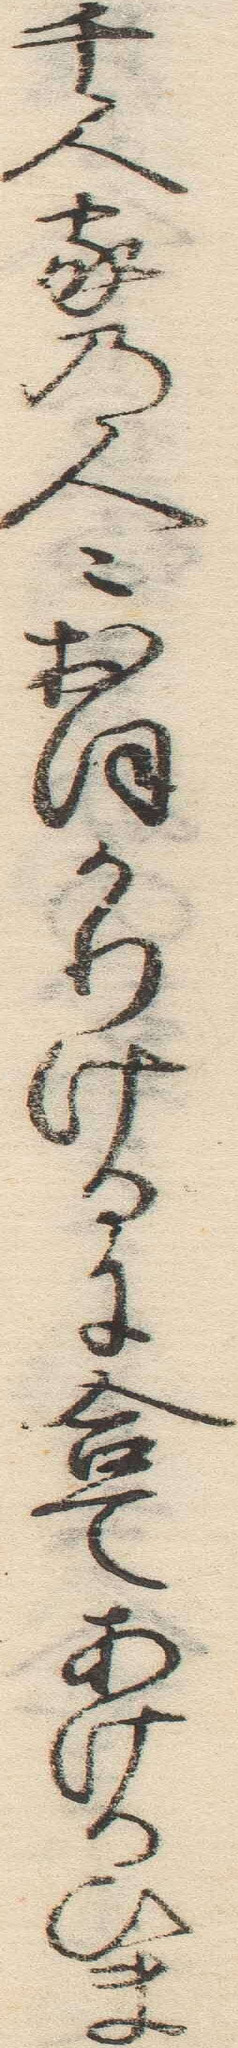千人家の人々おほかりけるに合てあけるひま
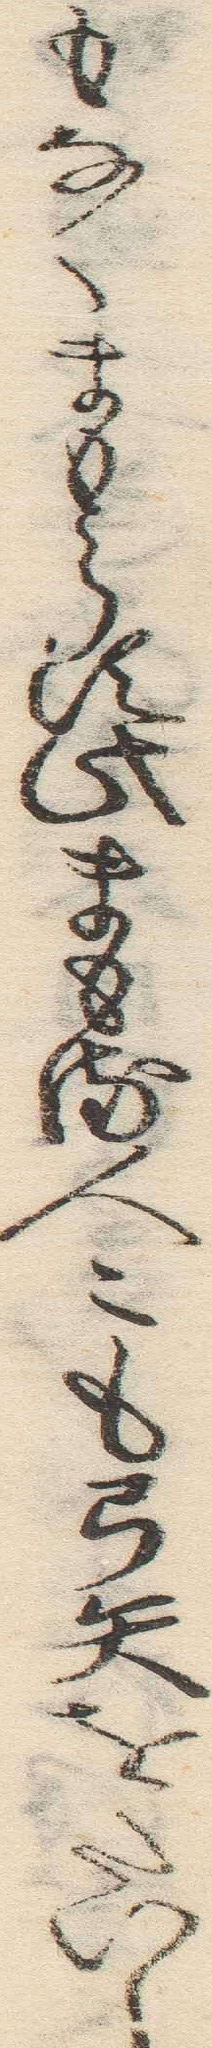もなくまもらす此まもる人々も弓矢をたいし
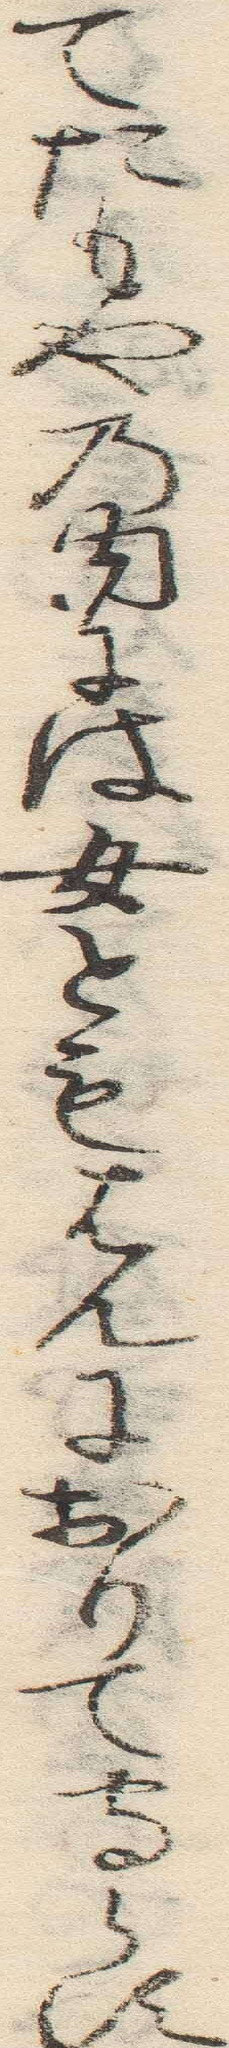ておもやの内には女ともはんにおりて守らす
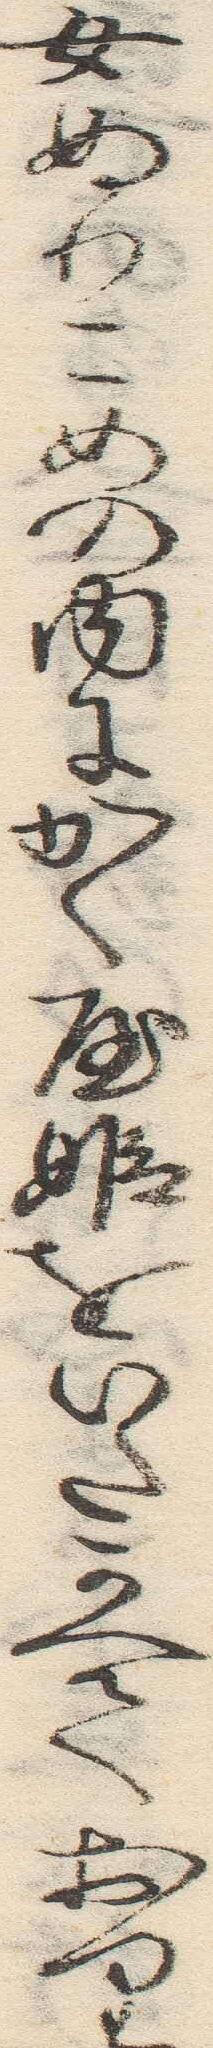女ぬりこめの内にかくや姫をいたかへており
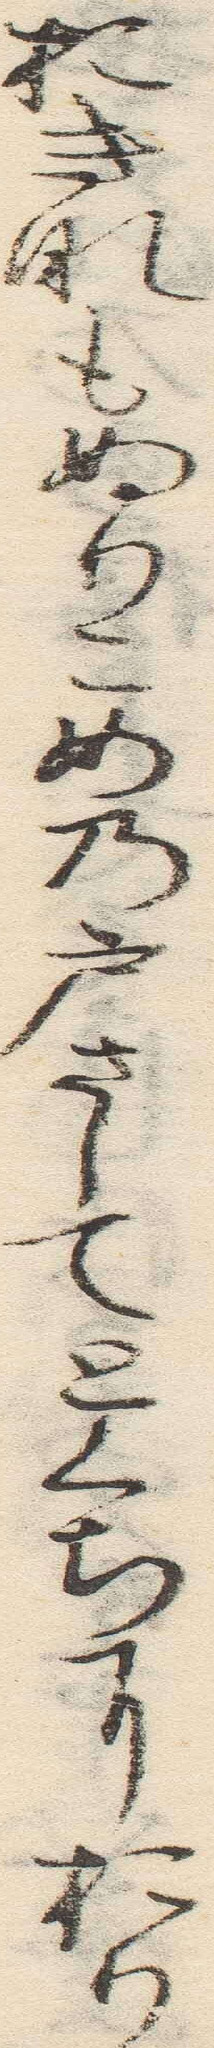おきなもぬりこめの戸さしてとくちにおり
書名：竹取物語
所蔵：東京学芸大学附属図書館 国文学研究資料館
